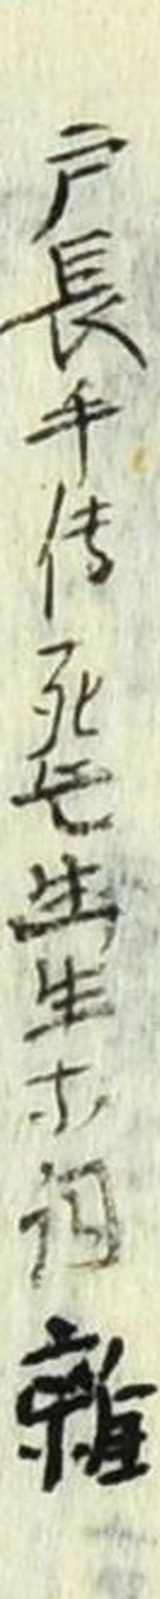戸長手伝死亡出生等調雑
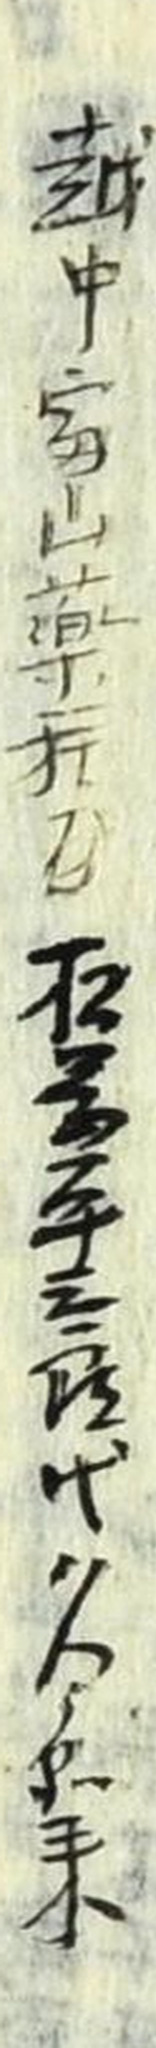越中富山薬種屋松岡平三郎代久兵衛来
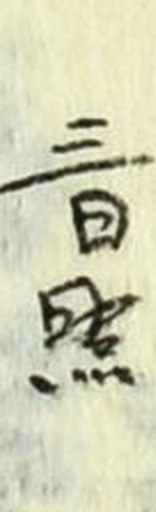三日照
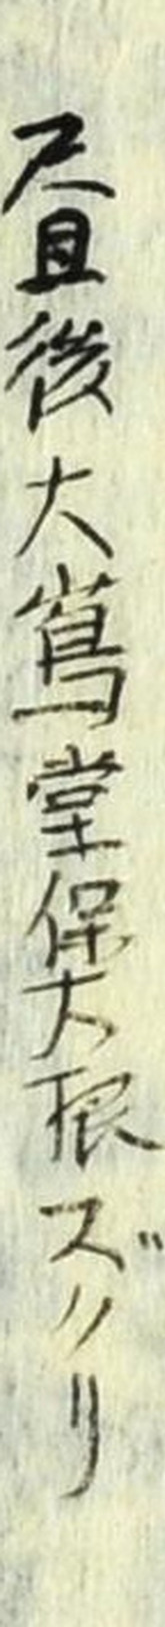雑昼後大島堂保大根ズクリ
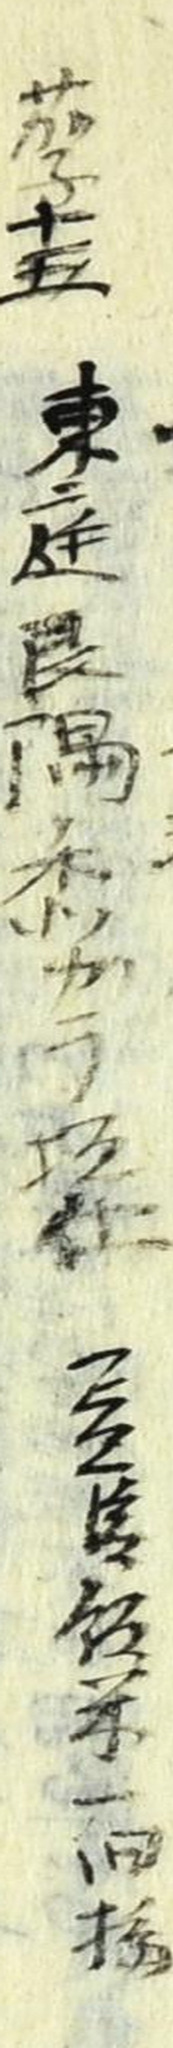東庭艮隅黍ガラ垣仕昼後飯米一臼搗
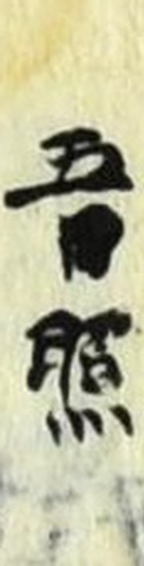三日照
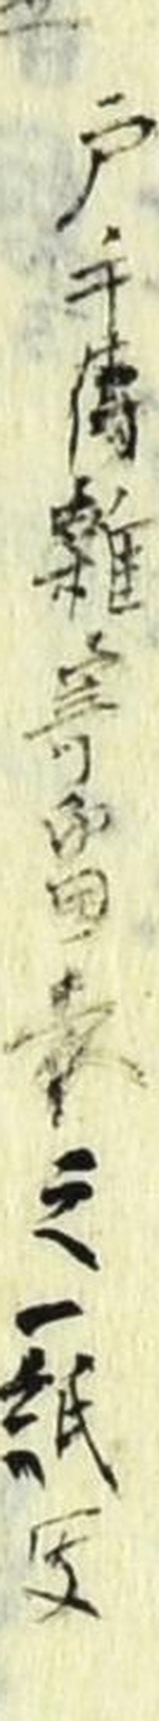戸手伝雑寄留表之一紙写
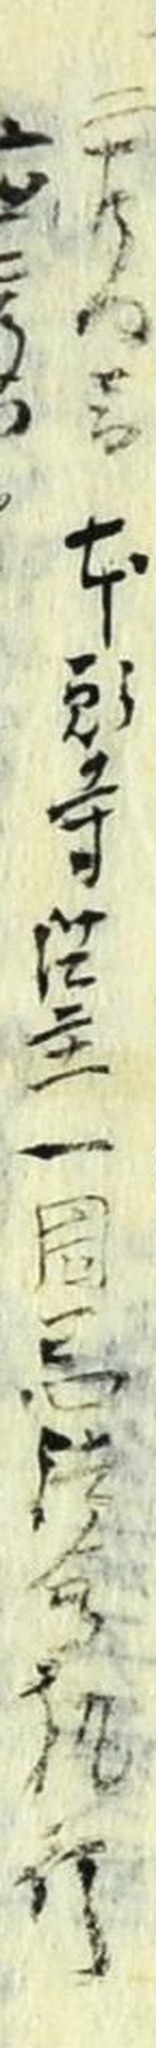二左衛門ニ而本願寺主一周忌法会執行
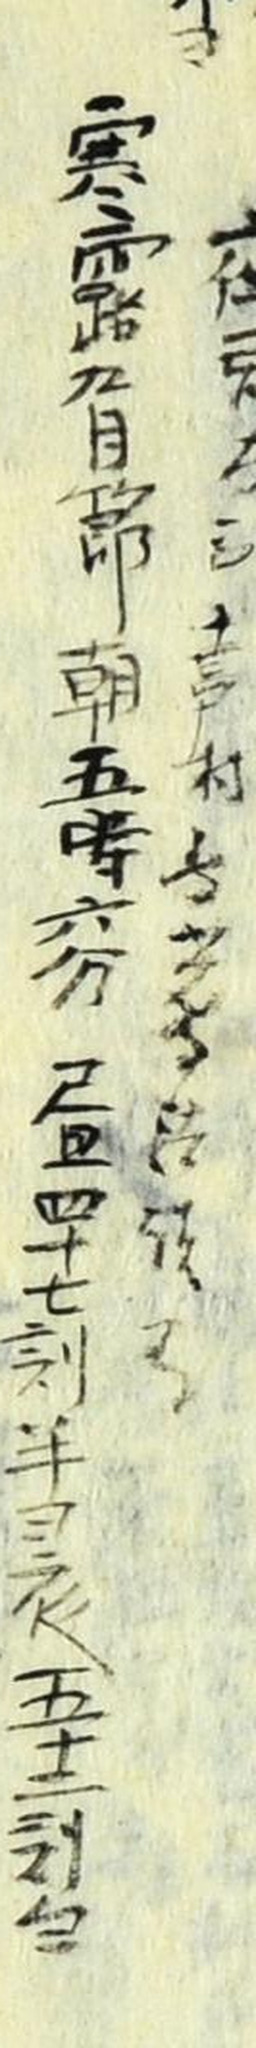寒露九月節朝五時六分昼四十七刻ヨ夜五十二刻半ヨ
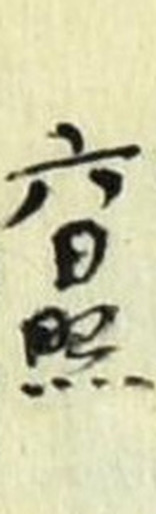三日照
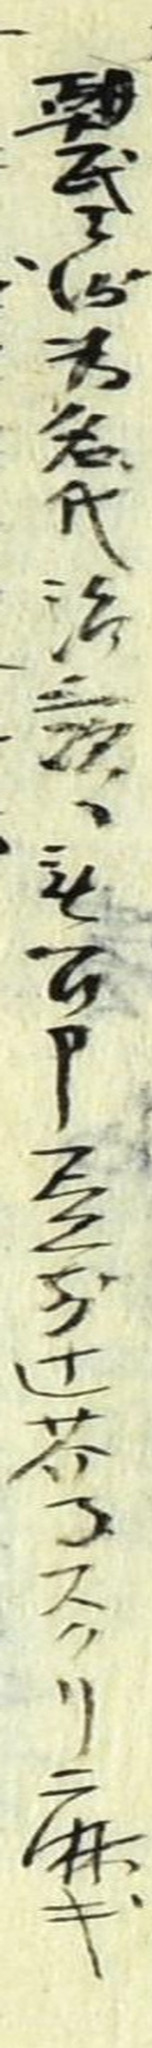朝武兵衛為名代治三次へ被召申昼前辻芥子スクリ麻ギ
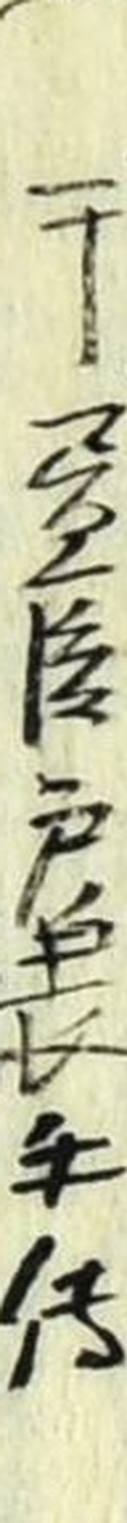干昼後戸長手伝
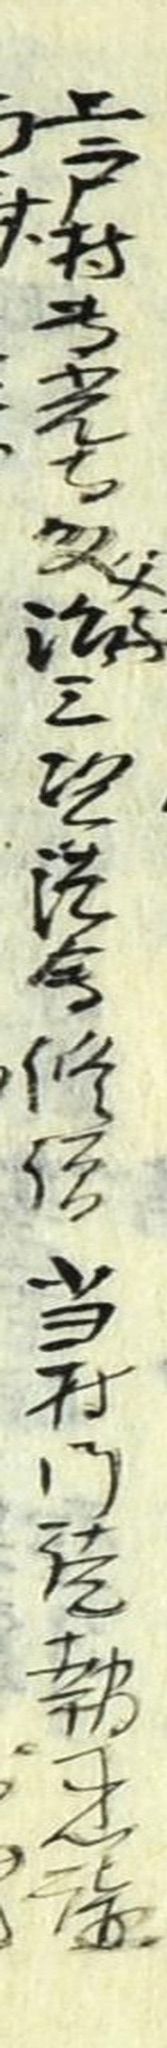上戸村専光寺父治三次法会修僧当村門徒報恩講
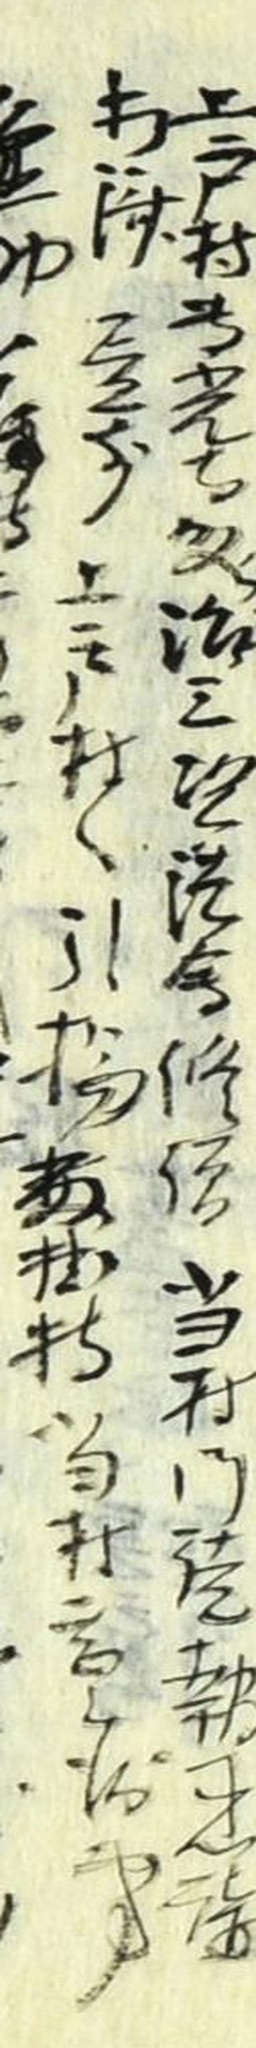相済昼前上戸村へ引揚当掛持当村甚兵衛弟
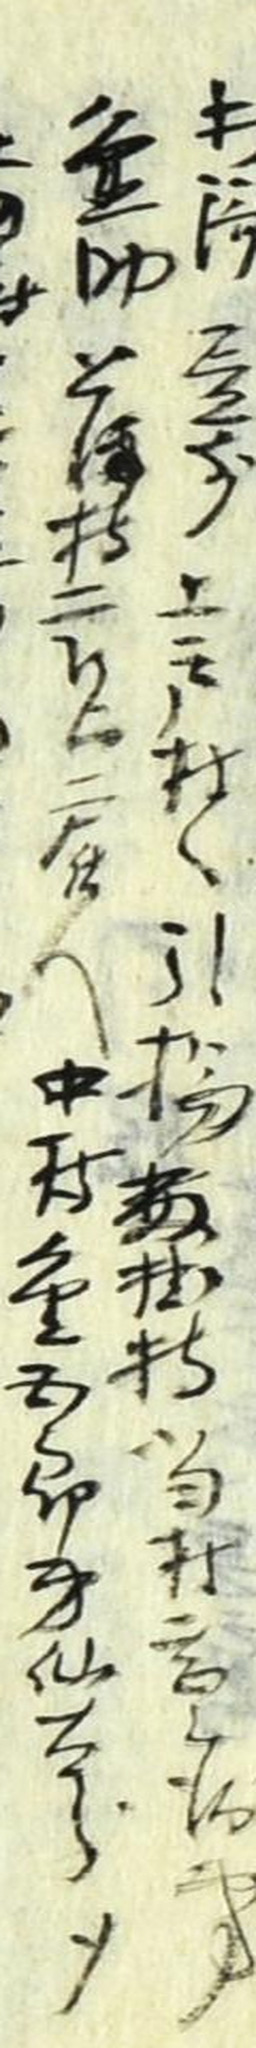金助荷持二左衛門雇人中村重五郎弟仙太郎〆
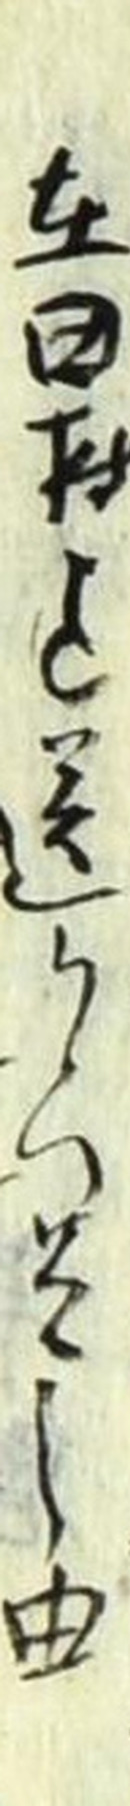在田村迄送り候人足之由
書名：（日記）
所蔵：福井県文書館 Fukui Prefectural Archives
